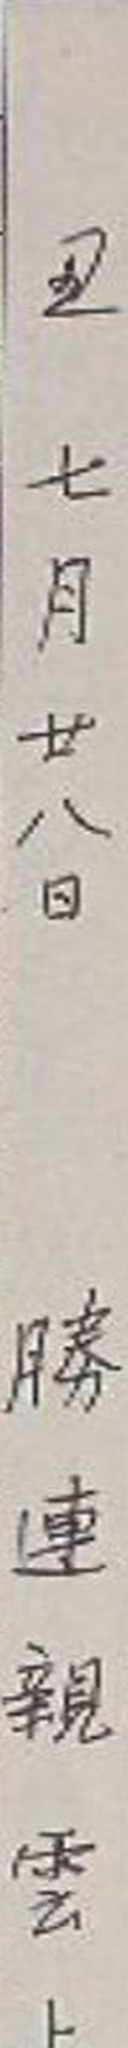丑七月廿八日勝連親雲上
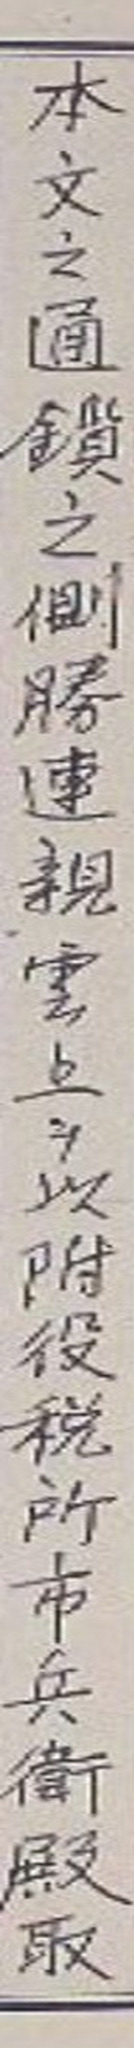本文之通鎖之側勝連親雲上を以附役税所市兵衛殿取
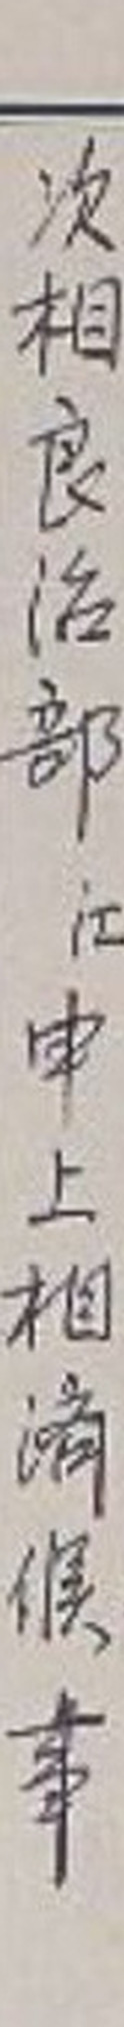次相良治部え申上相済候事
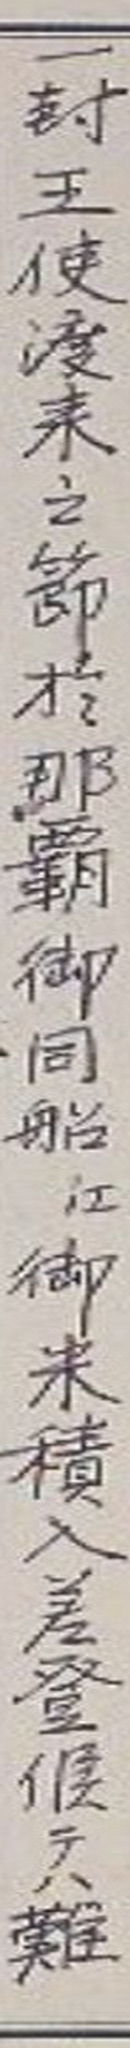一封王使渡来之節於那覇御同船え御米積入差登候ては難
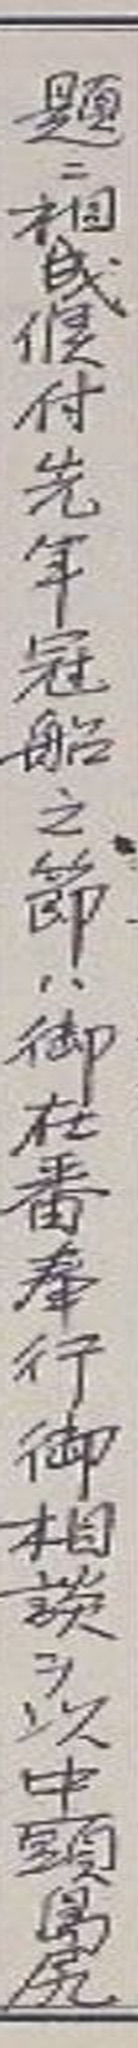題に相成候付先年冠船之節は御在番奉行御相談を以中頭島尻
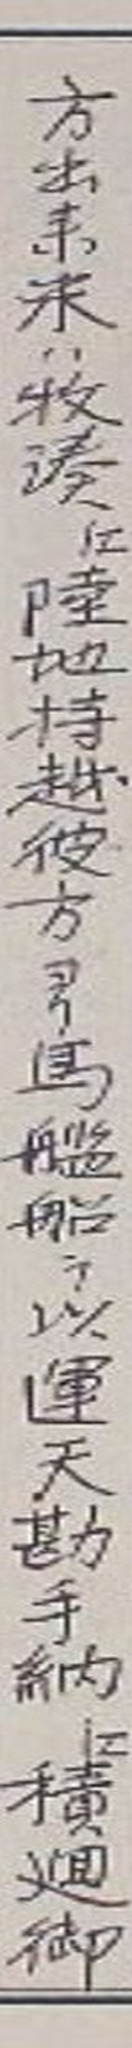方出来米は牧湊え陸地持越彼方より馬艦船を以運天勘手納え積廻御
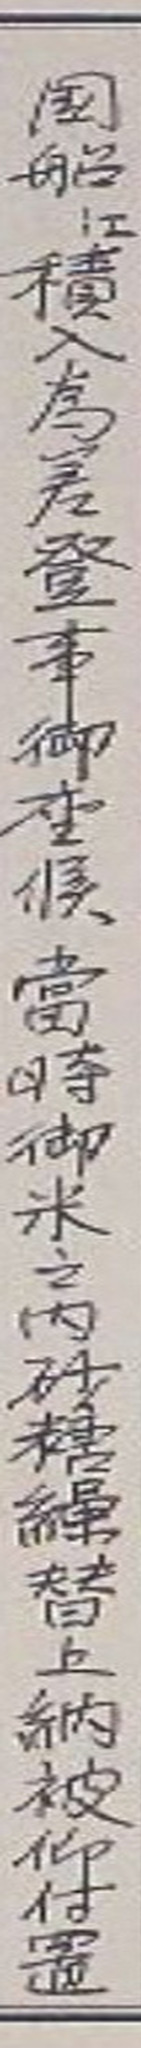国船え積入為差登事御座候当時御米之内砂糖繰替上納被仰付置
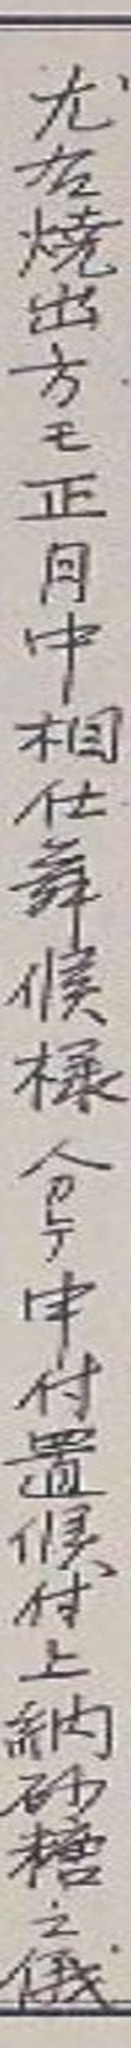尤右焼出方も正月中相仕舞候様分て申付置候付上納砂糖之儀
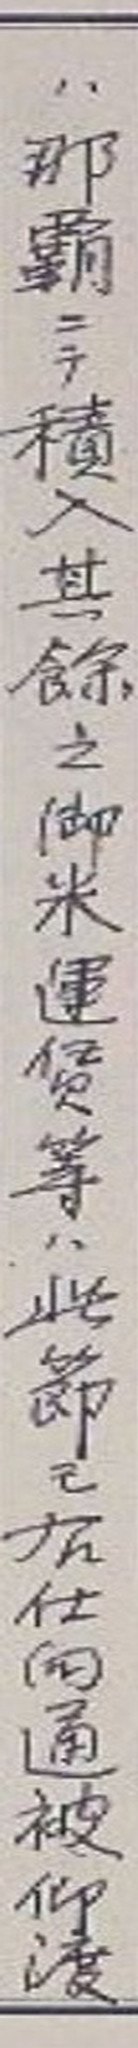は那覇にて積入其余之御米運賃等は此節も右仕向通被仰渡
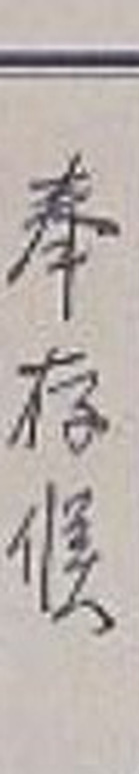奉存候
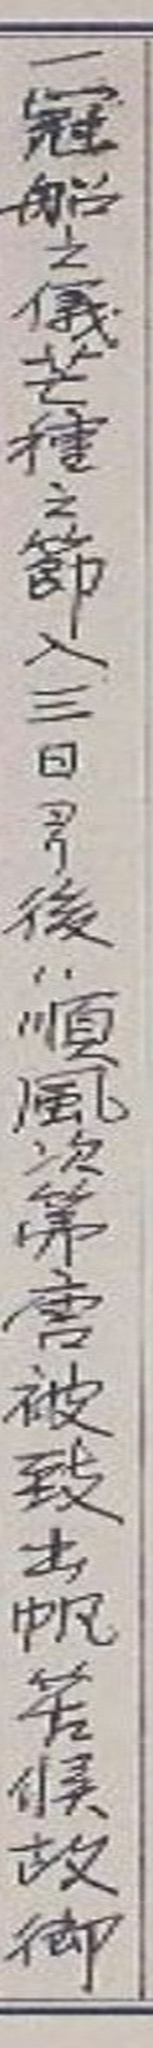一冠船之儀芒種之節入三日より後は順風次第唐被致出帆筈候故御
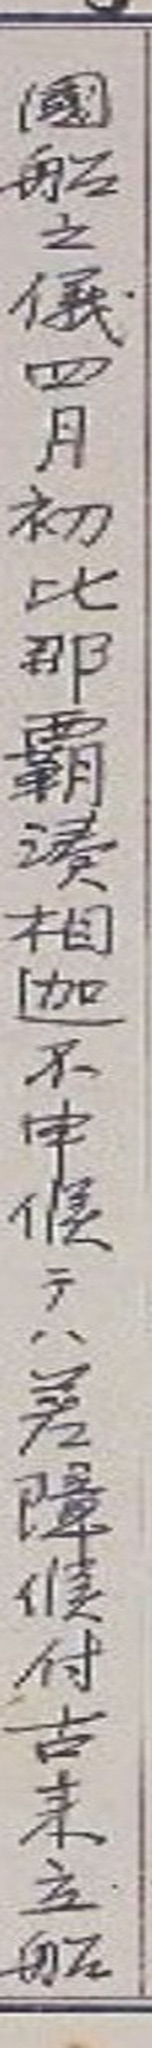国船之儀四月初比那覇湊相迦不申候ては差障候付古来立船
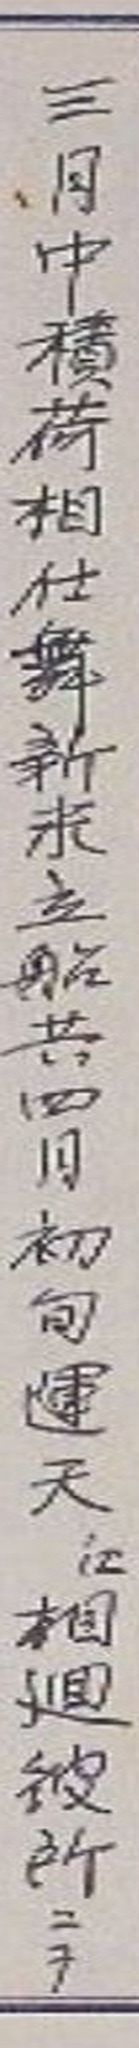三月中積荷相仕舞新米立船共四月初旬運天え相廻彼所にて
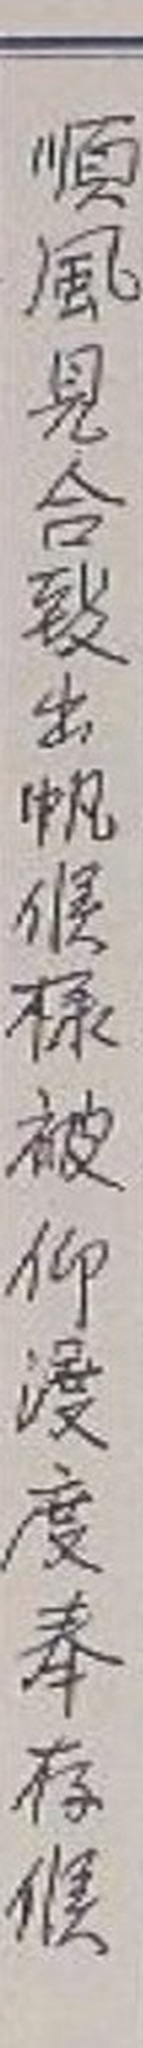順風見合致出帆候様被仰渡度奉存候

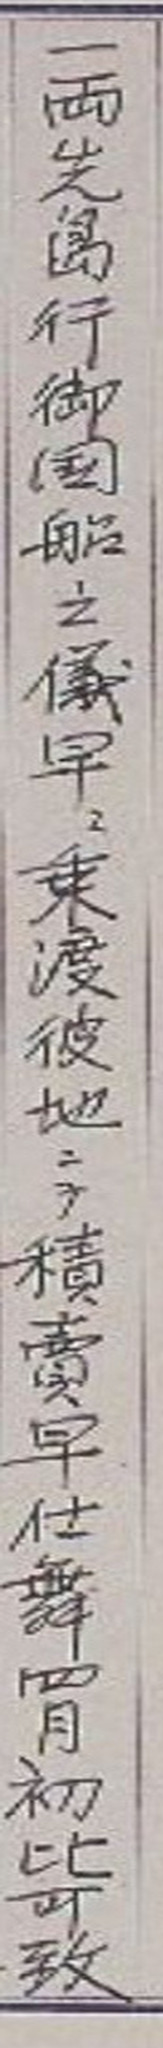一両先島行御国船之儀早々乗渡彼地にて積売早仕舞四月初比可致
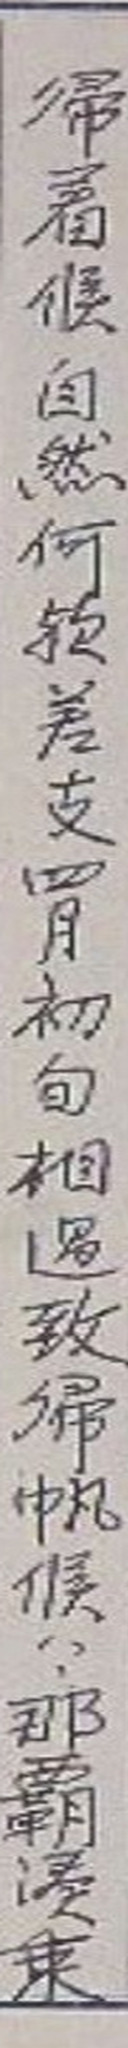帰着候自然何歟差支四月初旬相過致帰帆候はゝ那覇湊乗
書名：支那冊封使来琉諸記 下巻
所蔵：University of the Ryukyus Library
